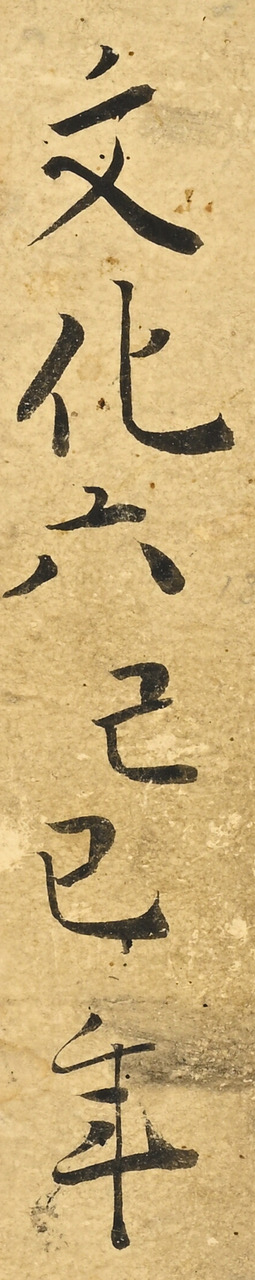文化六己巳年
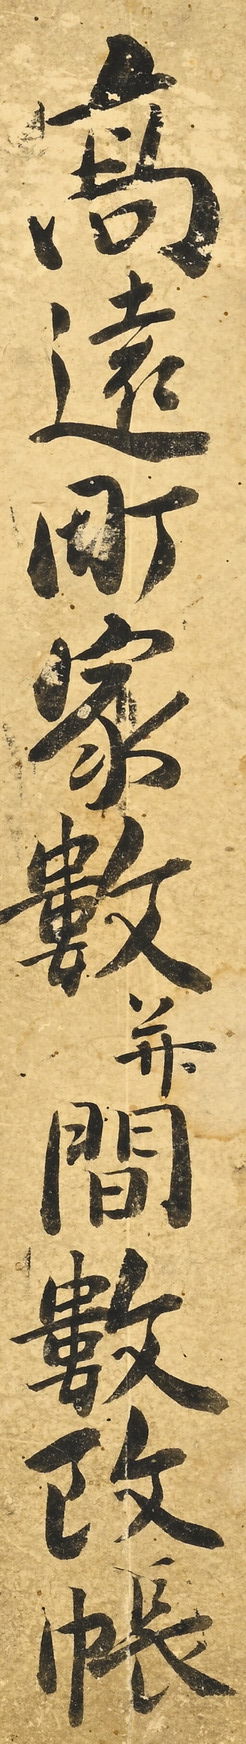高遠町家数并間数改帳
